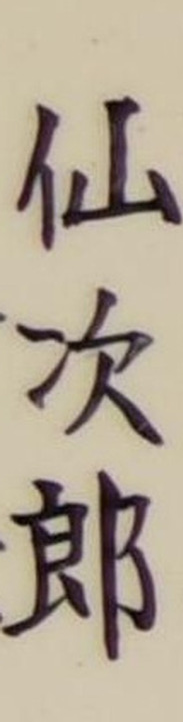仙次郎

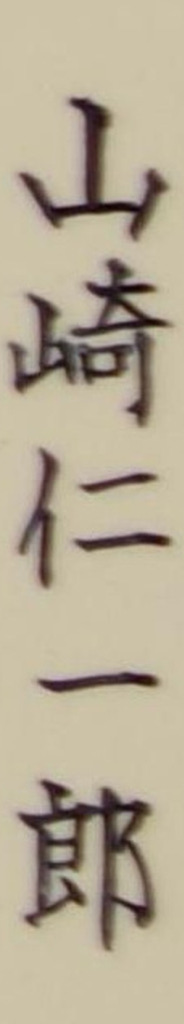山崎仁一郎
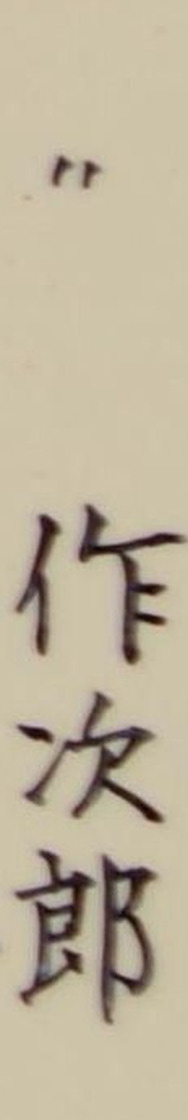作次郎
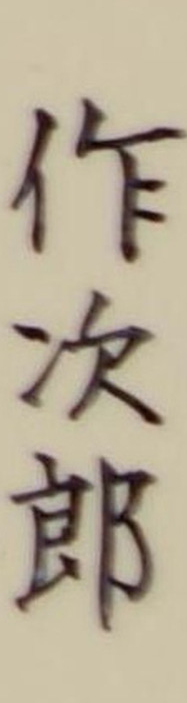作次郎
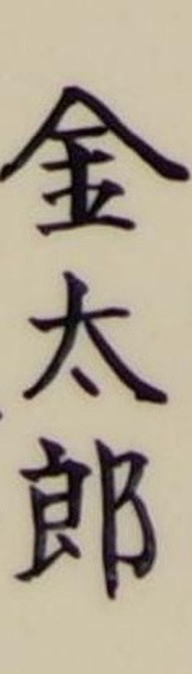金太郎
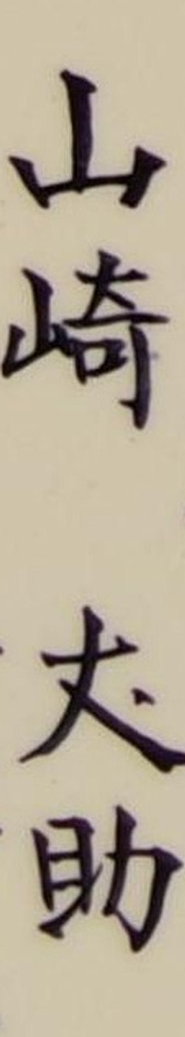山崎丈助
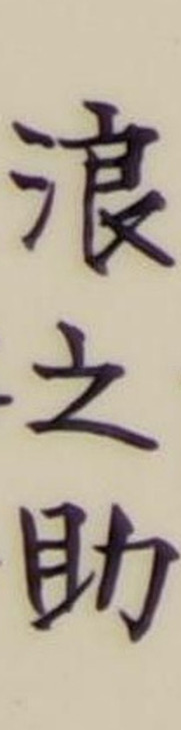浪之助

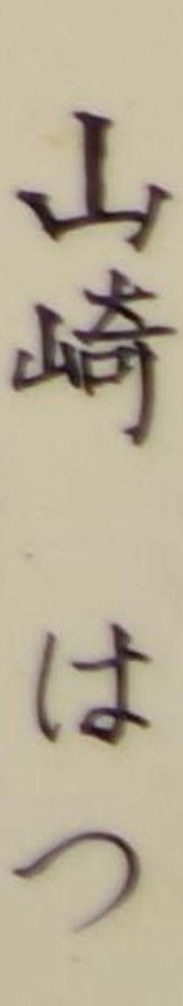山崎はつ
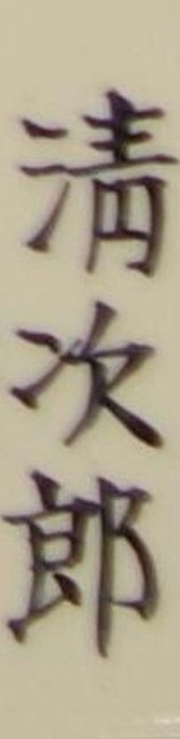清次郎
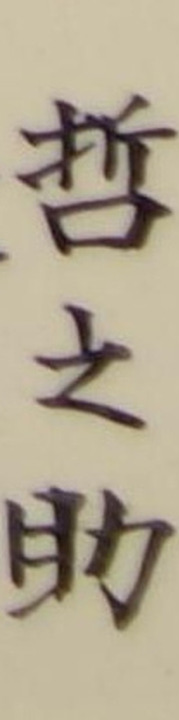哲之助
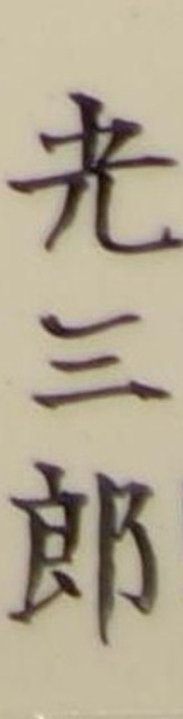光三郎
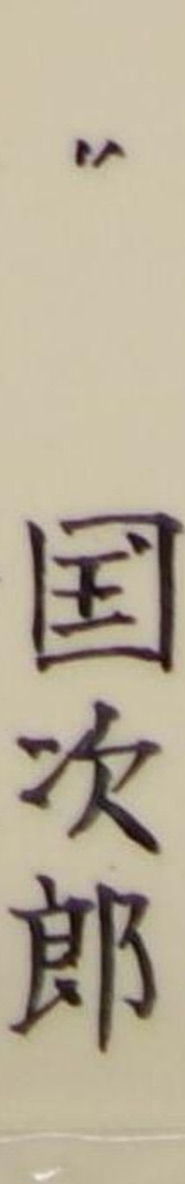国次郎
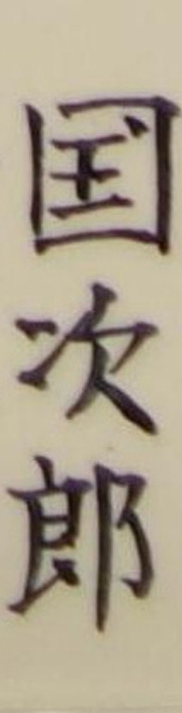国次郎
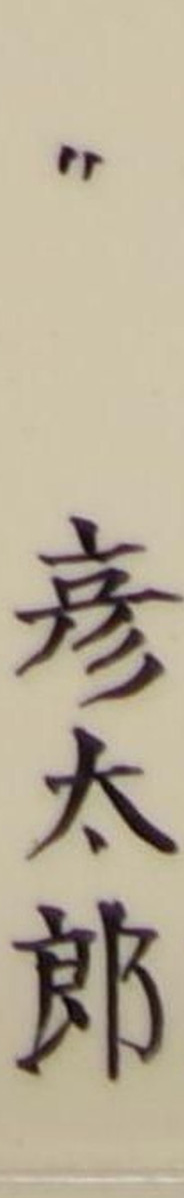彦太郎
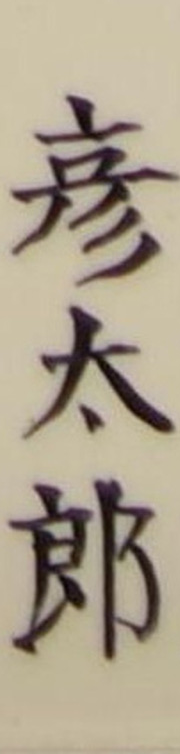彦太郎
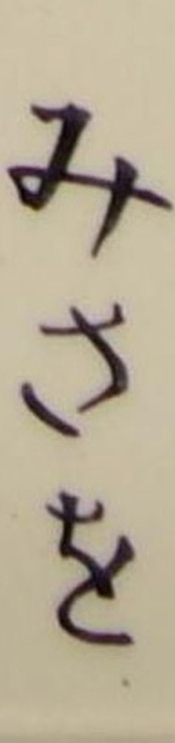みさを
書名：A~D
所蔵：koyasan kongobuji
